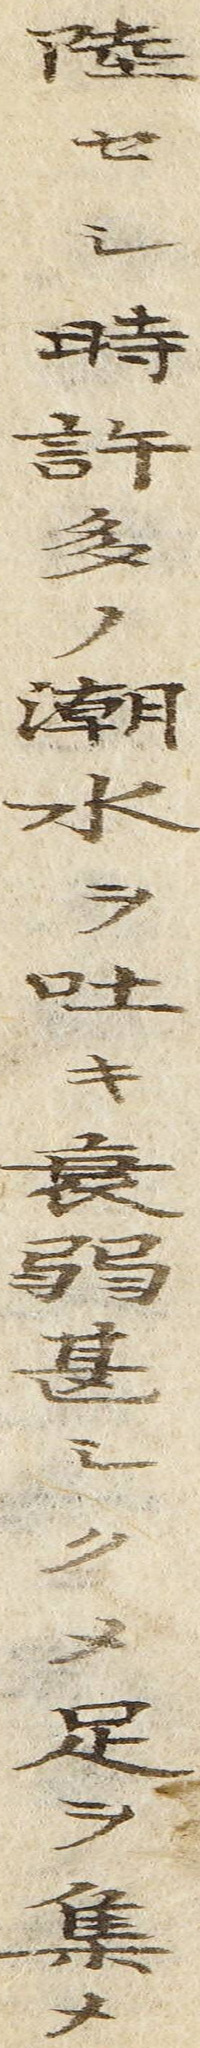陸セシ時許多ノ潮水ヲ吐キ衰弱甚シクシテ足ヲ集メ
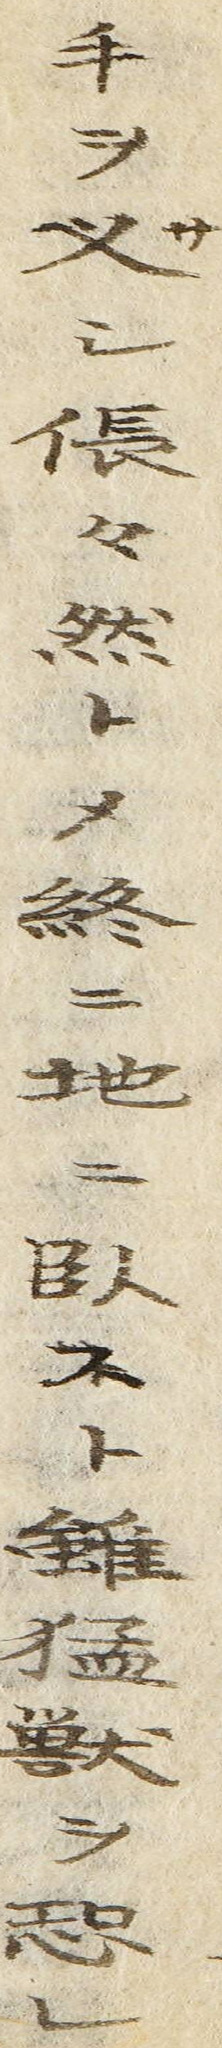手ヲ叉シ倀々然トシテ終ニ地ニ臥スト雖猛獣ヲ恐レ
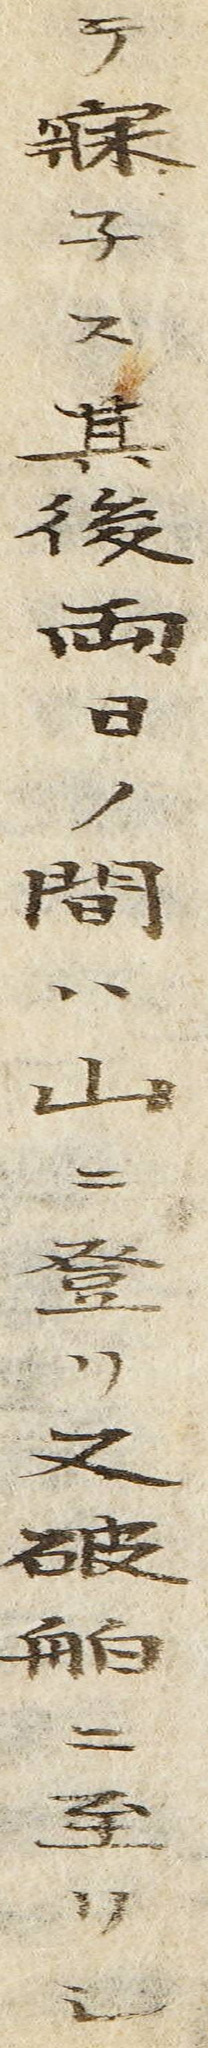テ寐ネス其後両日ノ間ハ山ニ登リ又破舶ニ至リシ
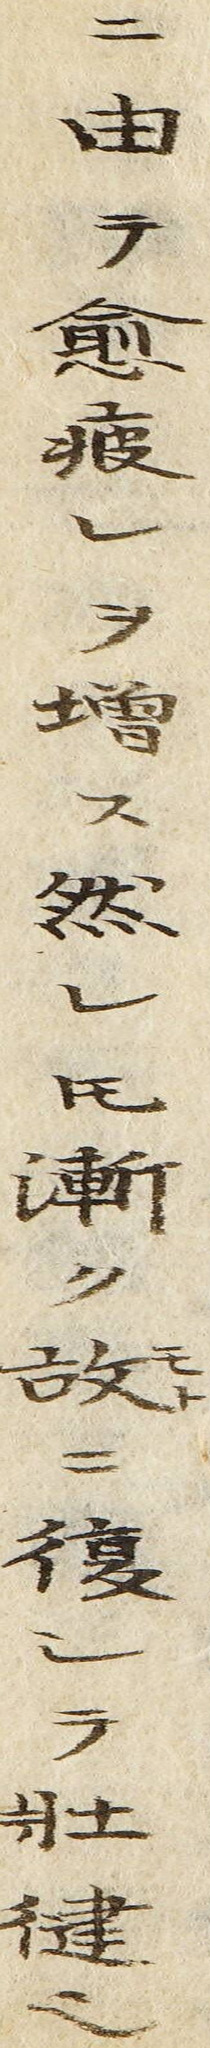ニ由テ愈疲レヲ増ス然レトモ漸ク故ニ復シテ壮健也
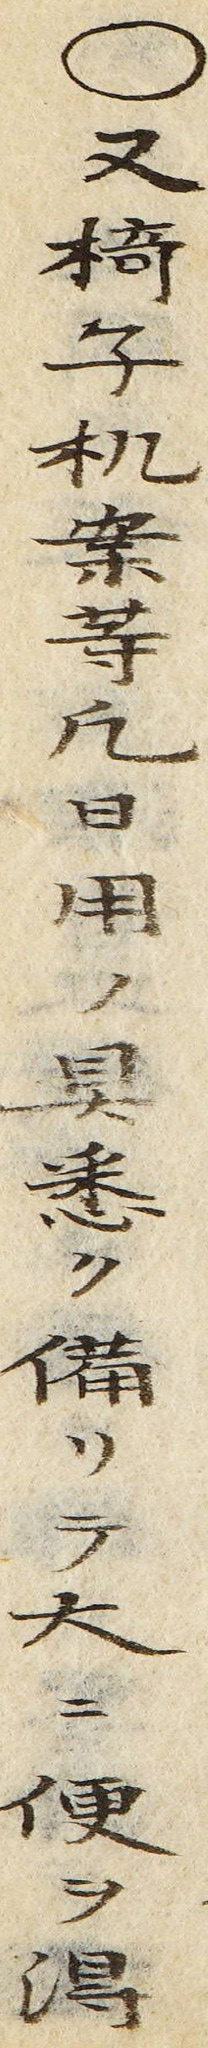◯又椅子机案等凡日用ノ具悉ク備リテ大ニ便ヲ得

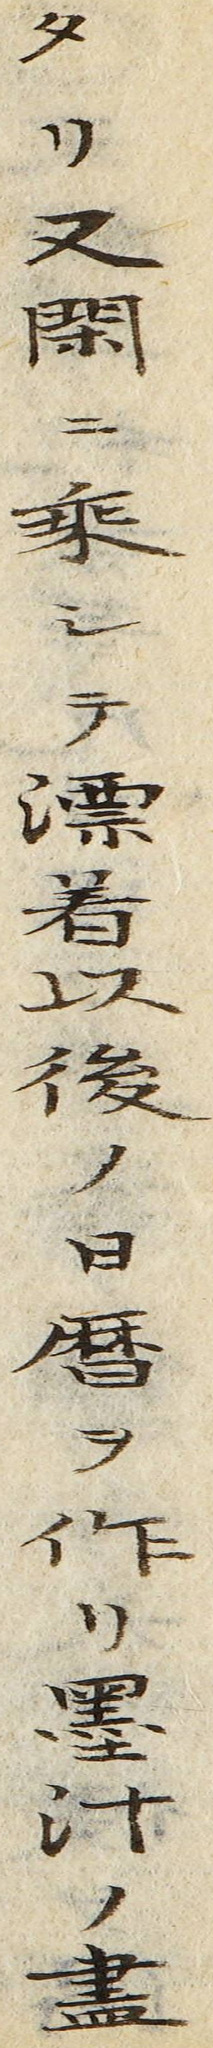タリ又閑ニ乗シテ漂着以後ノ日暦ヲ作リ墨汁ノ尽
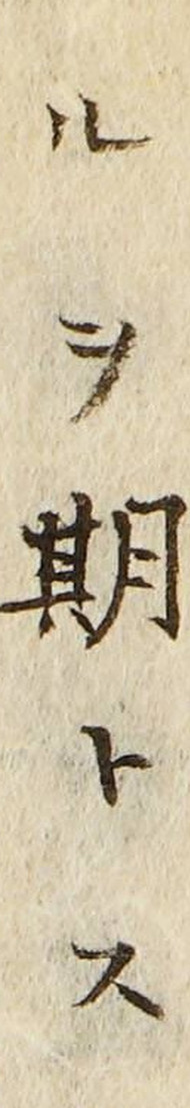ルヲ期トス
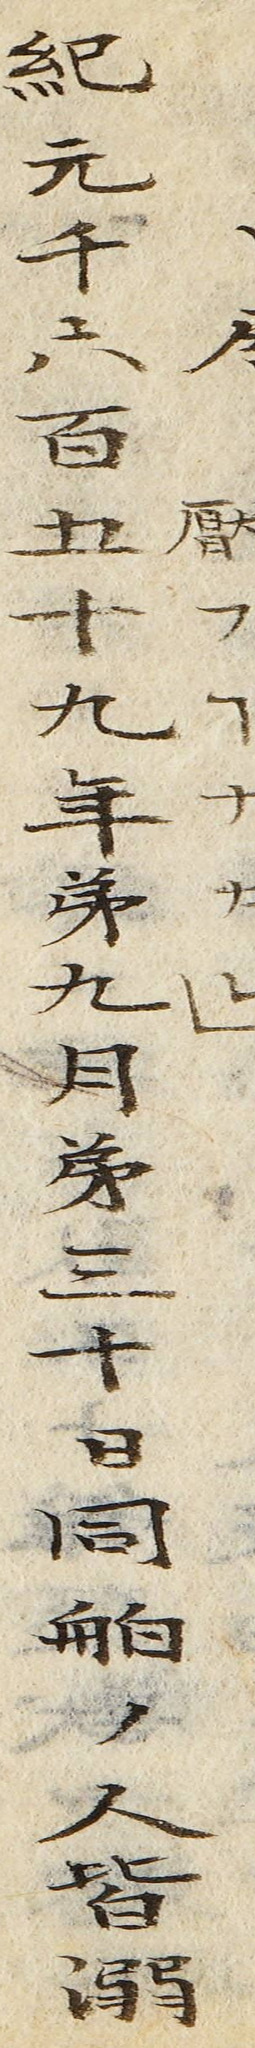紀元千六百五十九年第九月第三十日同舶ノ人皆溺
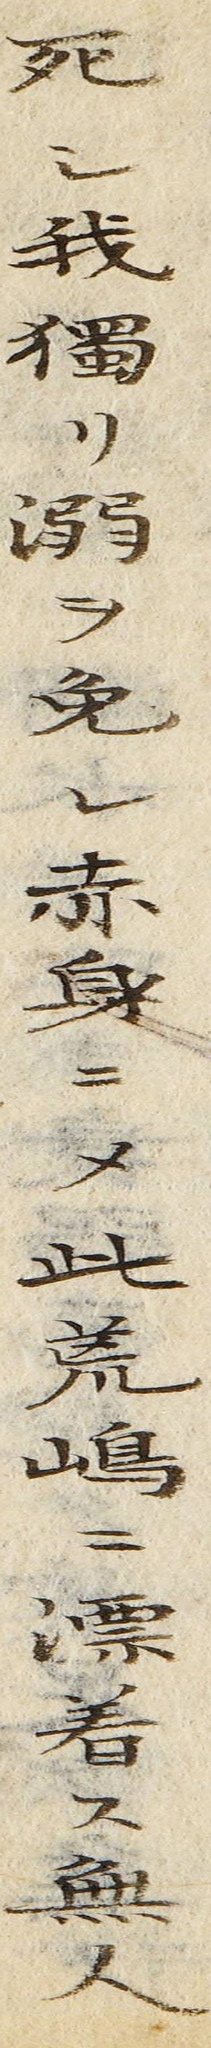死シ我独リ溺ヲ免レ赤身ニシテ此荒島ニ漂着ス無人
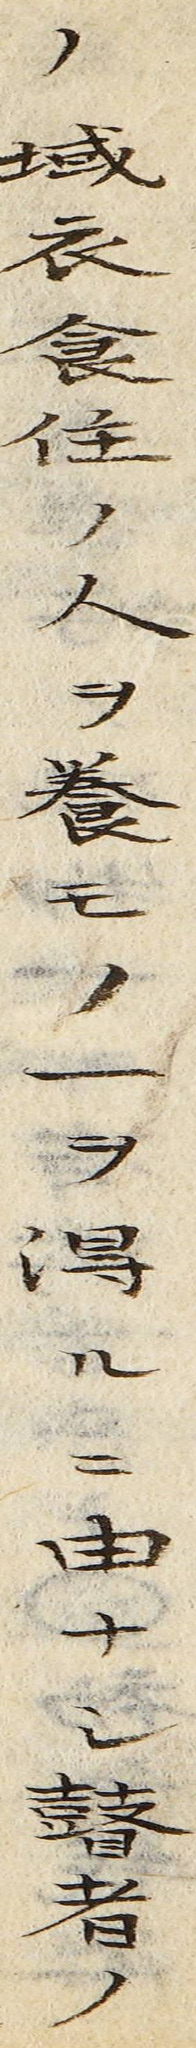ノ域衣食住ノ人ヲ養モノ一ヲ得ルニ由ナシ瞽者ノ
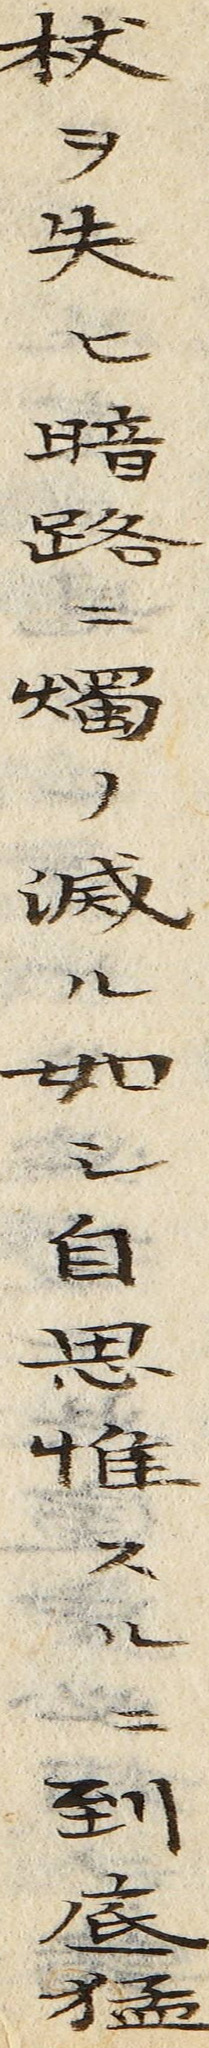杖ヲ失ヒ暗路ニ燭ノ滅ル如シ自思惟スルニ到底猛
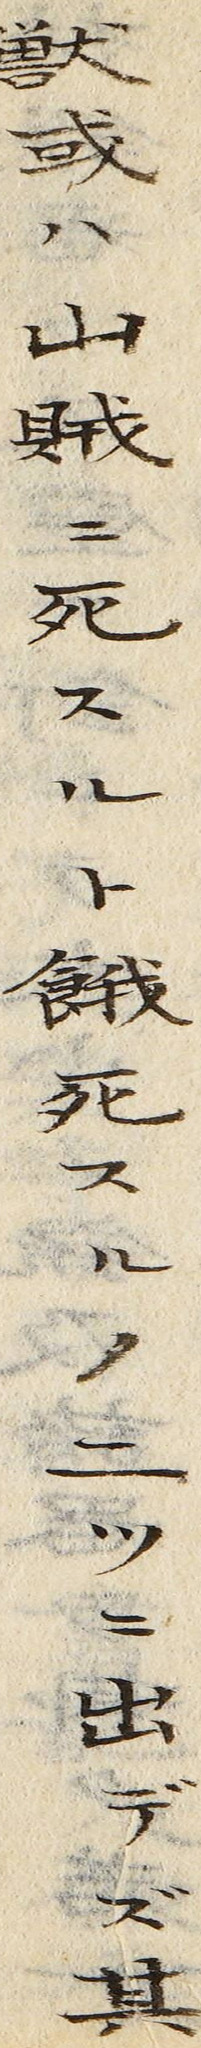獣或ハ山賊ニ死スルト餓死スルノ二ツニ出デズ其
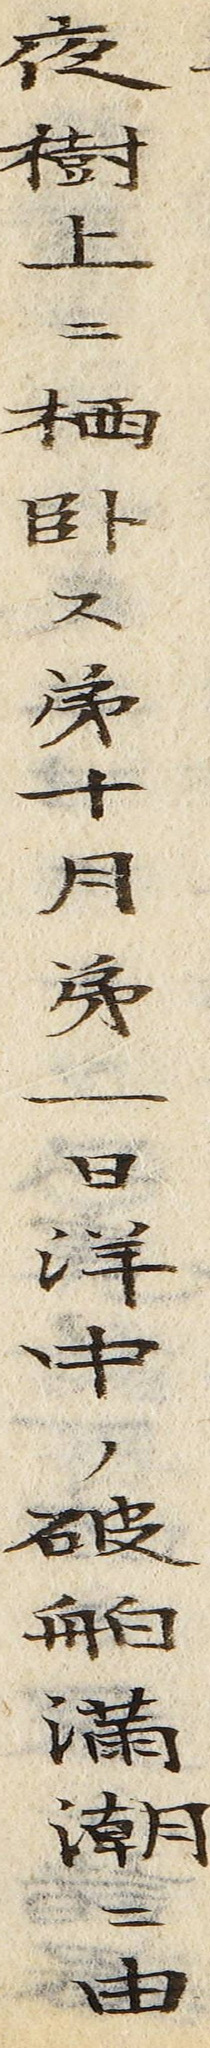夜樹上ニ栖臥ス第十月第一日洋中ノ破舶満潮ニ由
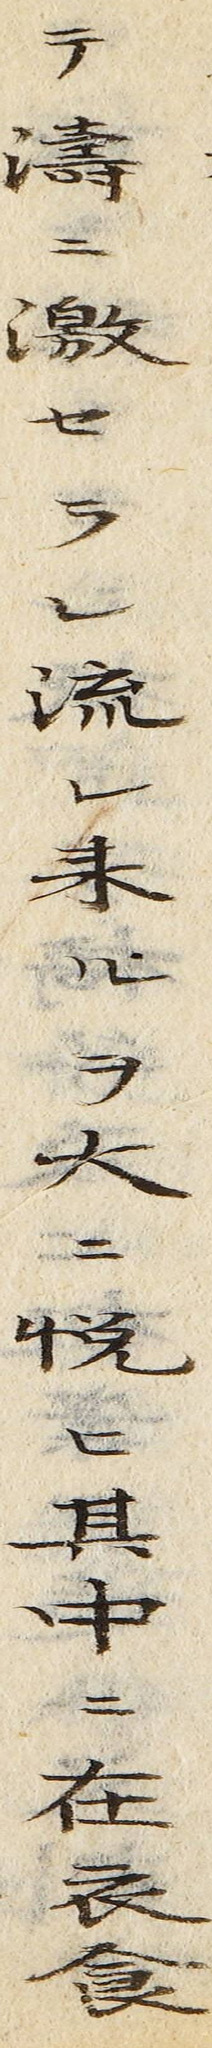テ濤ニ激セラレ流レ来ルヲ大ニ悦ヒ其中ニ在衣食
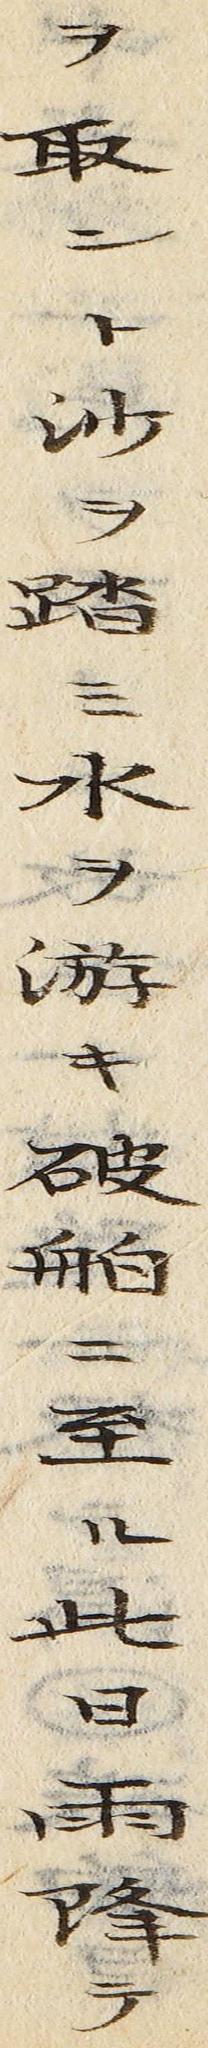ヲ取ント沙ヲ踏ミ水ヲ游キ破舶ニ至ル此日雨降テ
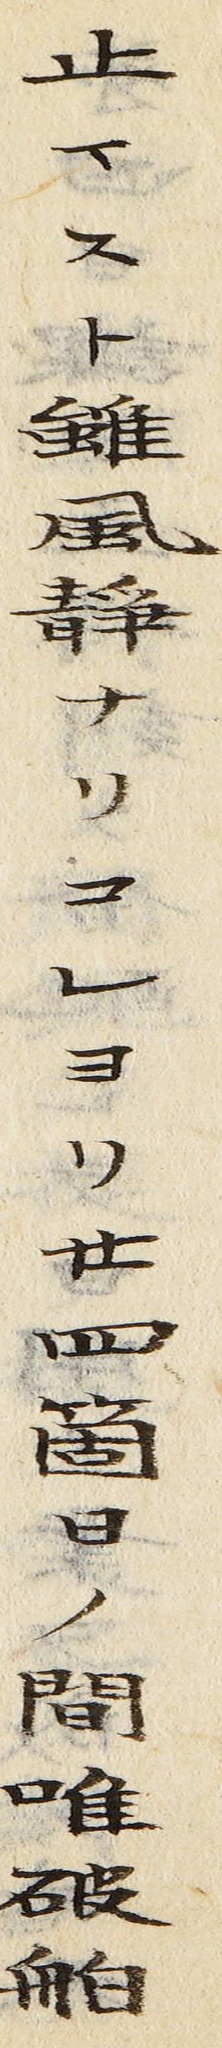止マスト雖風静ナリコレヨリ廿四箇日ノ間唯破舶
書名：漂流紀事
